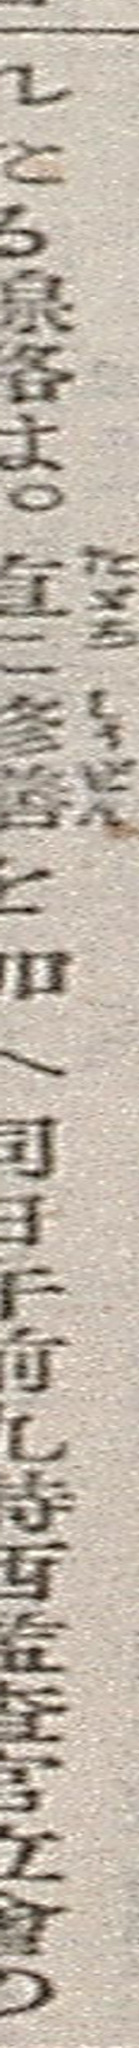れたる線路は。直に修繕を加へ同日午前九時西監査官立会の
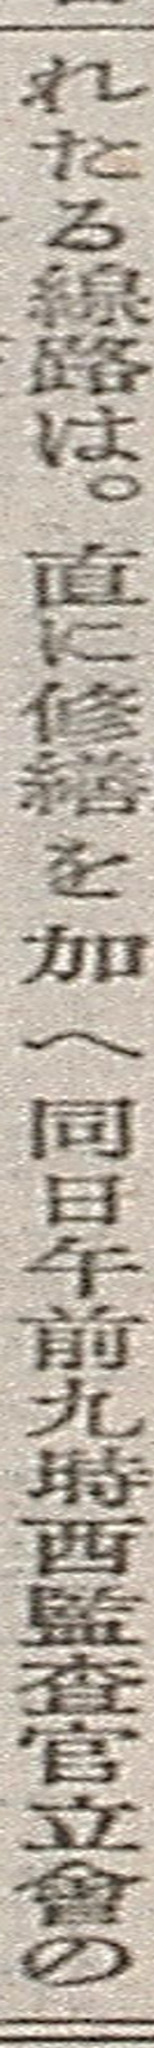れたる線路は。直に修繕を加へ同日午前九時西監査官立会の
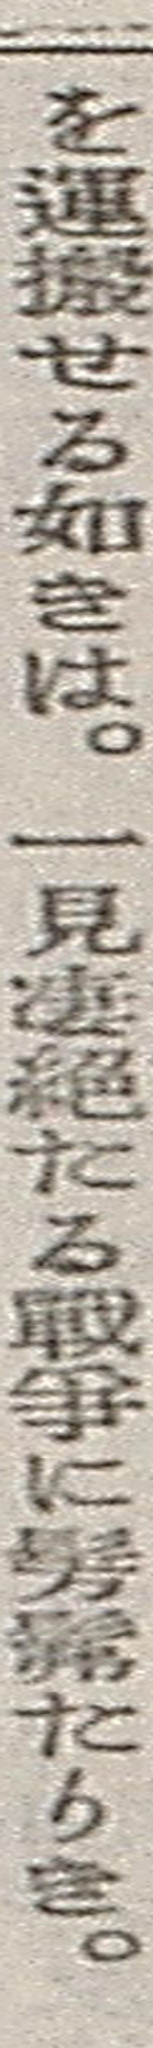を運搬せる如きは。一見凄絶たる戦争に髣髴たりき。
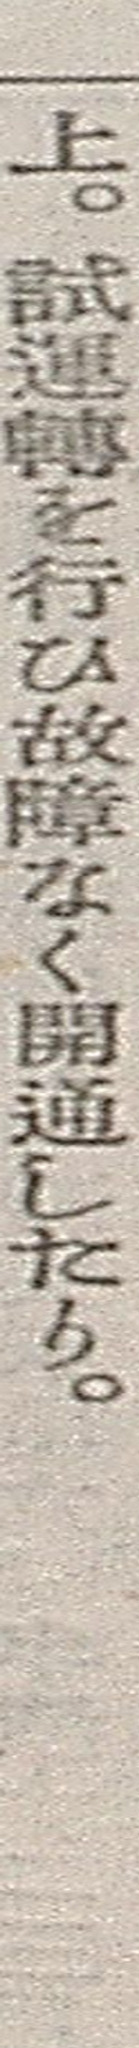上。試運転を行ひ故障なく開通したり。
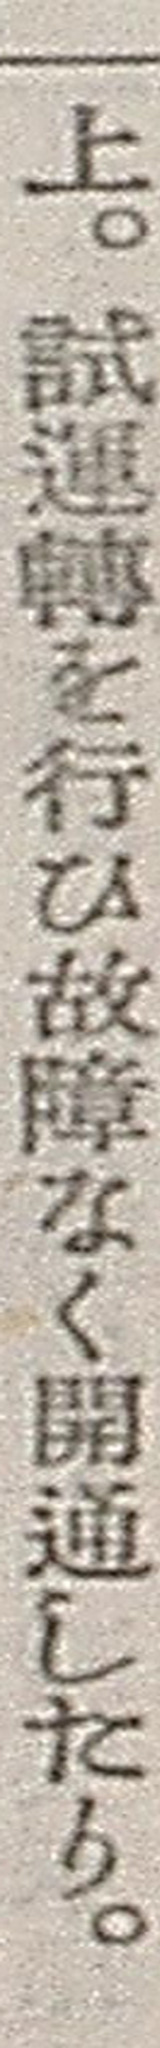上。試運転を行ひ故障なく開通したり。
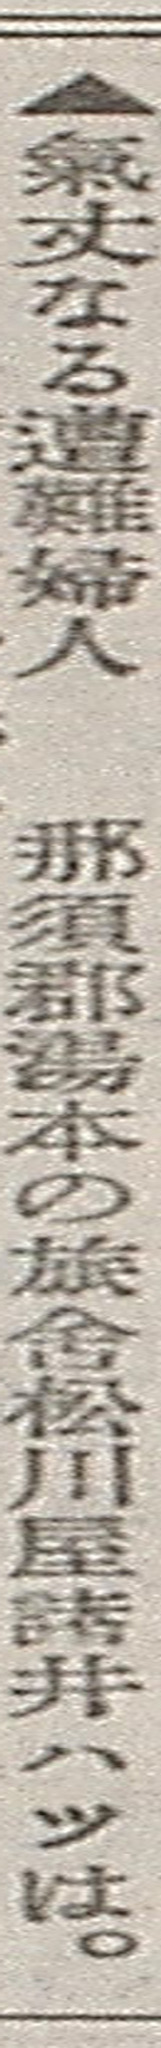▲気丈なる遭難婦人那須郡湯本の旅舎松川屋諸井ハツは。
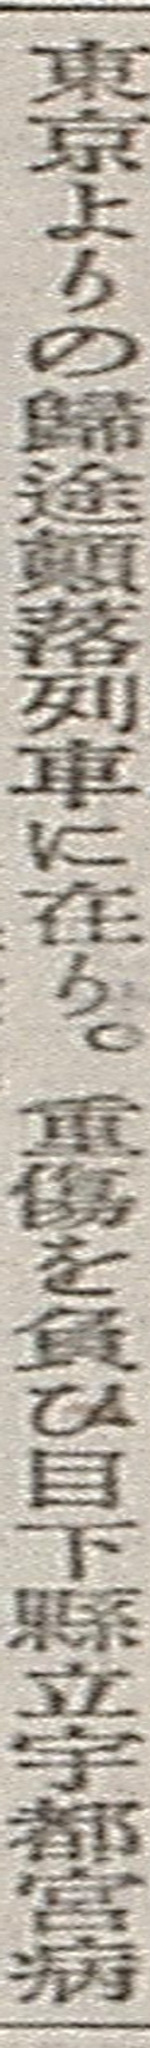東京よりの帰途顛落列車に在り。重傷を負ひ目下県立宇都宮病
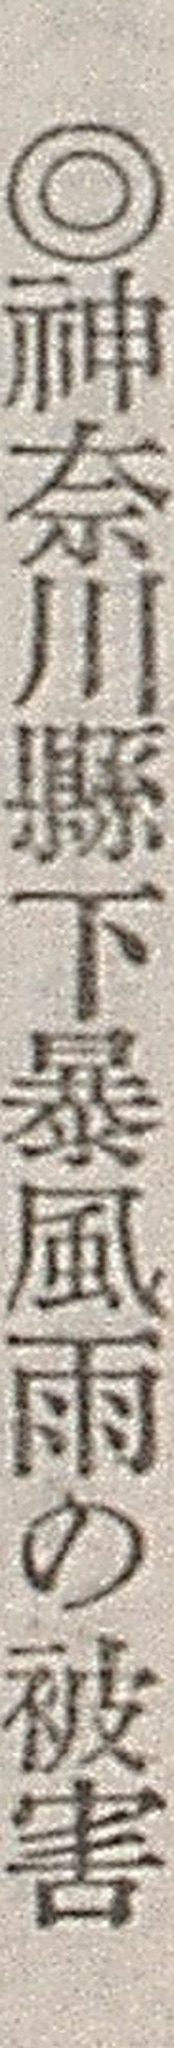◎神奈川県下暴風雨の被害
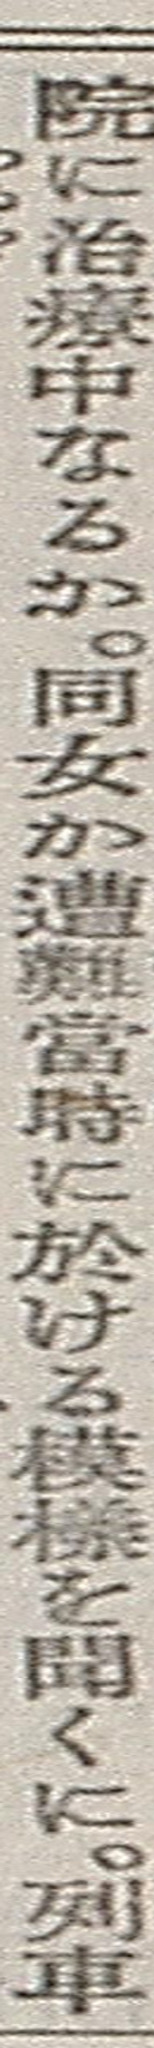院に治療中なるか。同女か遭難当時に於ける模様を聞くに。列車
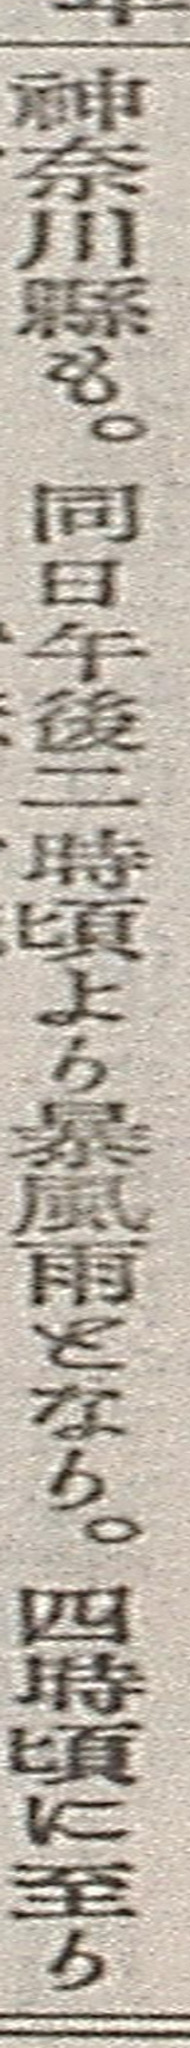神奈川県も。同日午後二時頃より暴風雨となり。四時頃に至り
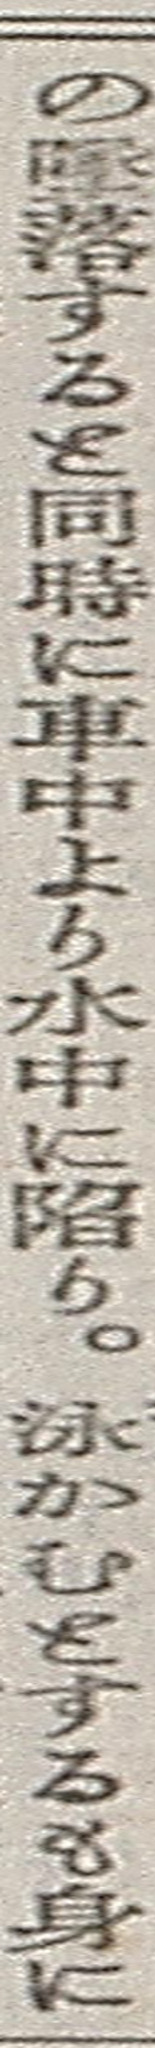の墜落すると同時に車中より水中に陥り。泳かむとするも身に
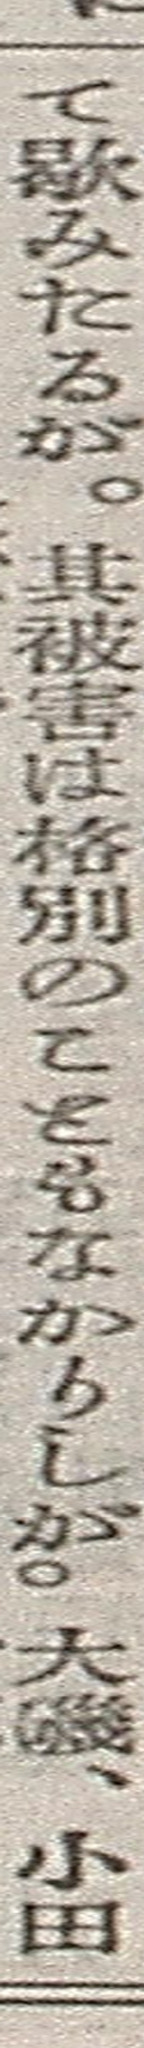て歇みたるが。其被害は格別のこともなかりしが。大磯、小田
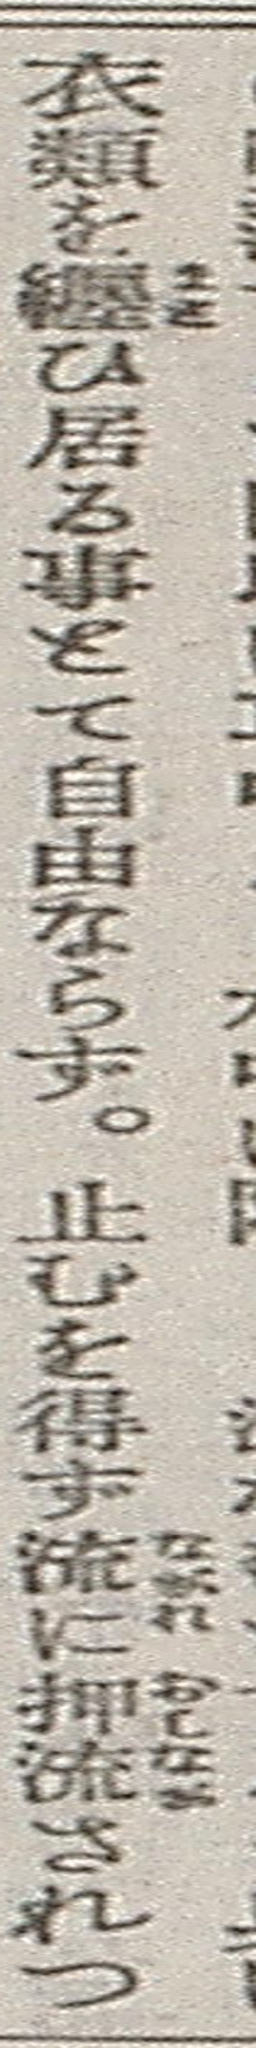衣類を纏ひ居る事とて自由ならず。止むを得ず流に押流されつ
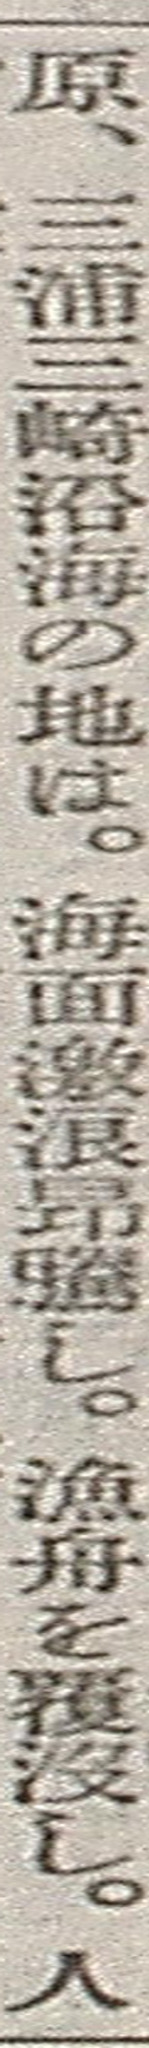原、三浦三崎沿海の地は。海面激浪昂騰し。漁舟を覆没し。人
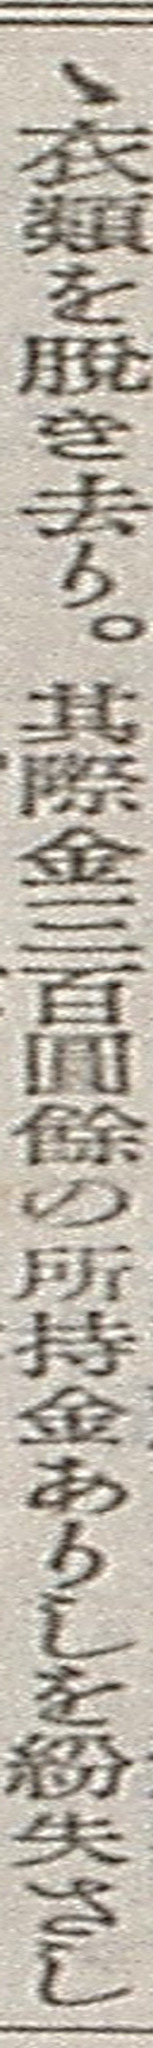ゝ衣類を脱き去り。其際金三百円余の所持金ありしを紛失さし
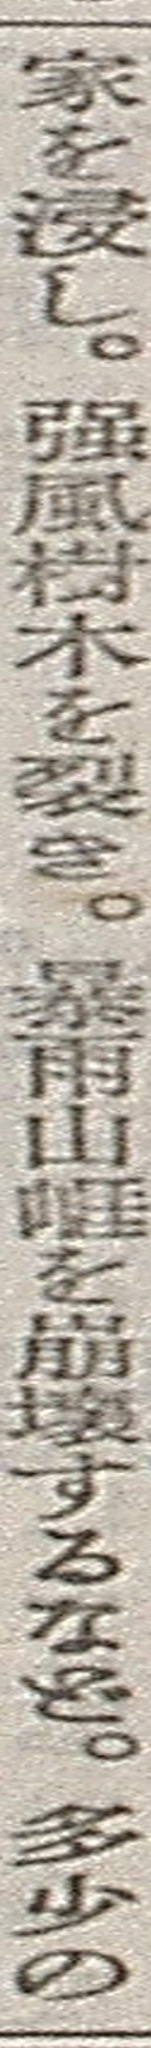家を浸し。強風樹木を裂き。暴雨山崕を崩壊するなど。多少の
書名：風俗畫報臨時増刊第百九十九號　明治三十二年十月各地災害圖會（前編之續）
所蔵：東京大学地震研究所図書室 Earthquake Research Institute Library, The University of Tokyo, JAPAN
